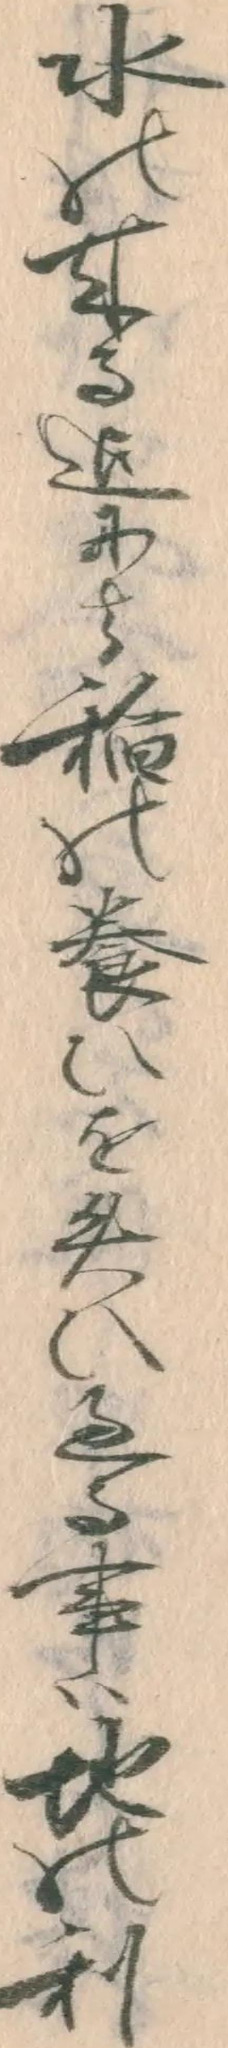水の来る迄にて稲の養ひを失ひ過る事は地の利
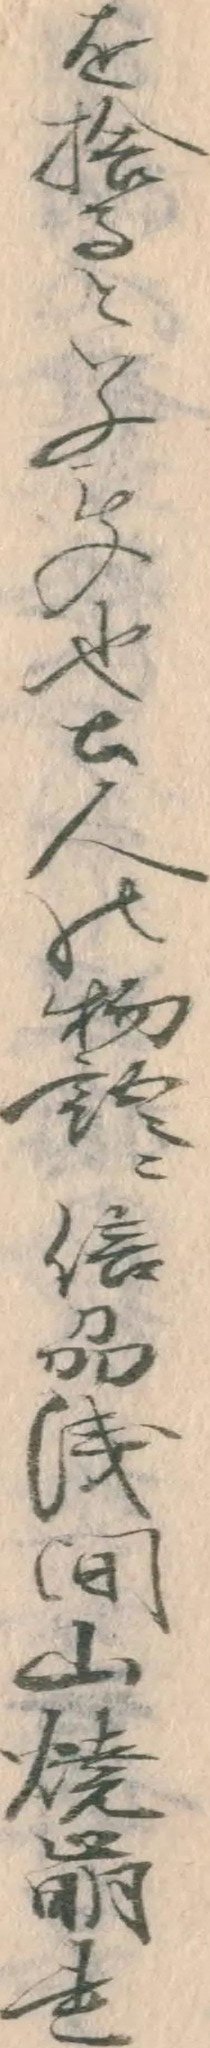を捨るといふもの也土人の物語に信州浅間山焼崩れ
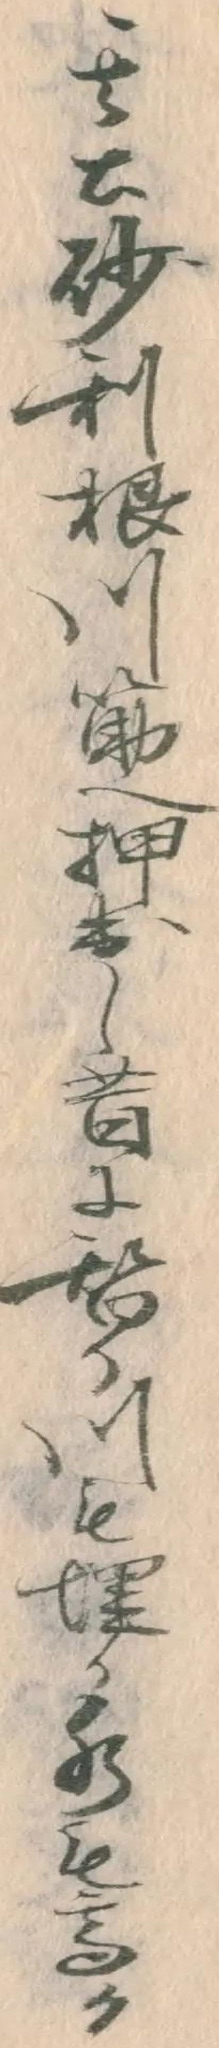其土砂利根川筋へ押出し昔に替り川も埋り水も高く
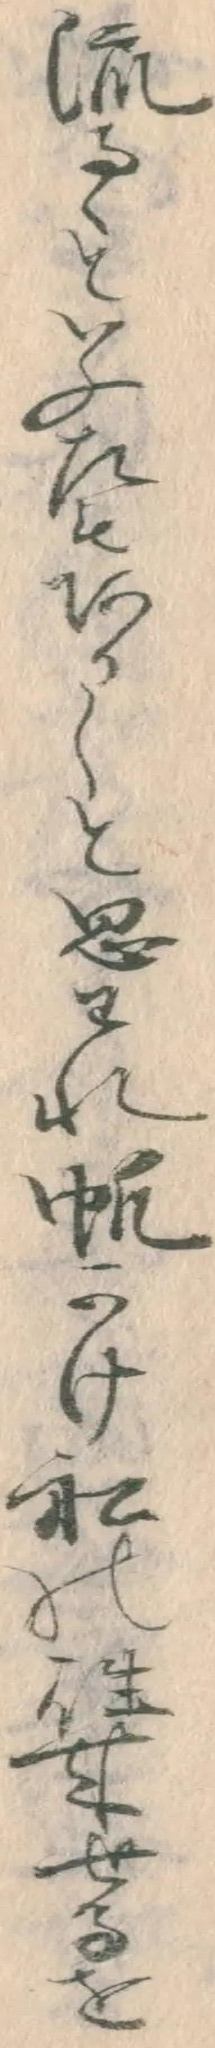流るゝといふ左もありしと思けれ帆かけ船の往来せるを
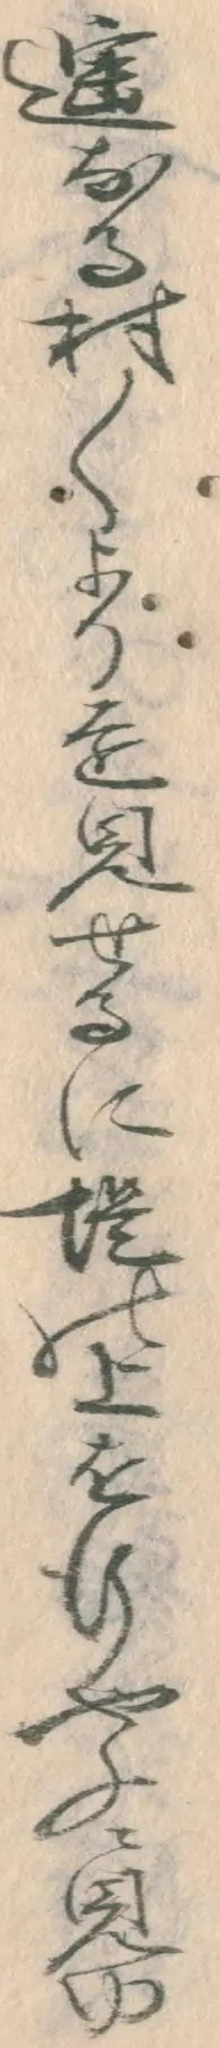遥なる村〳〵より遠見せるに堤の上を行やふに見ゆ
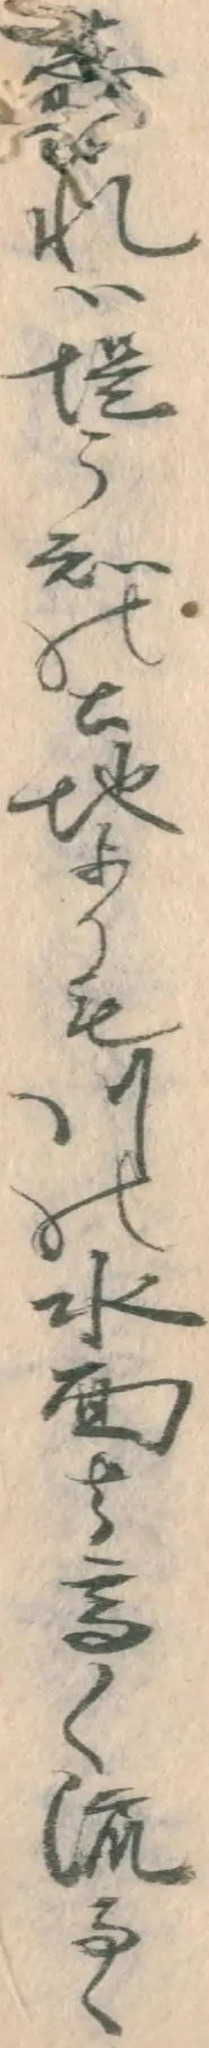れは堤うちの土地よりも川の水面高く流るゝ

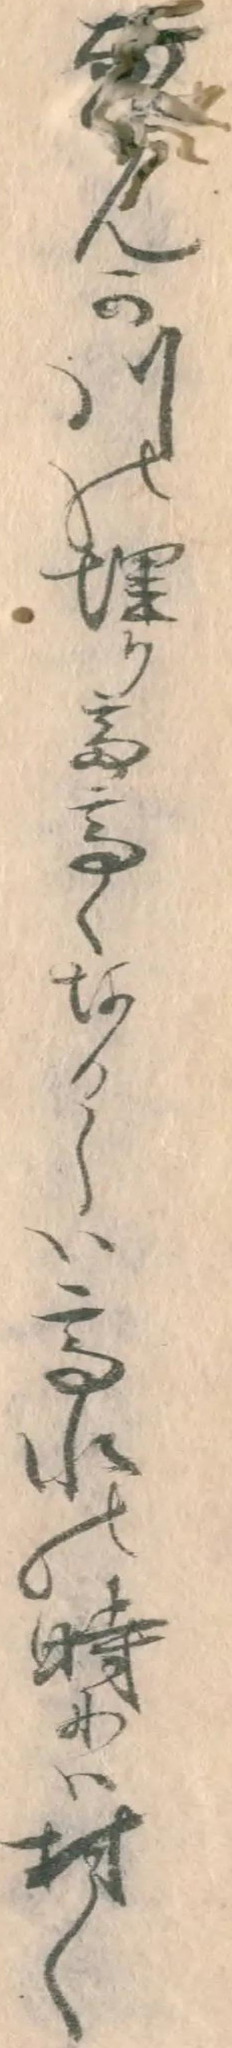んか川の埋りて高くなりしは高水の時には村〳〵
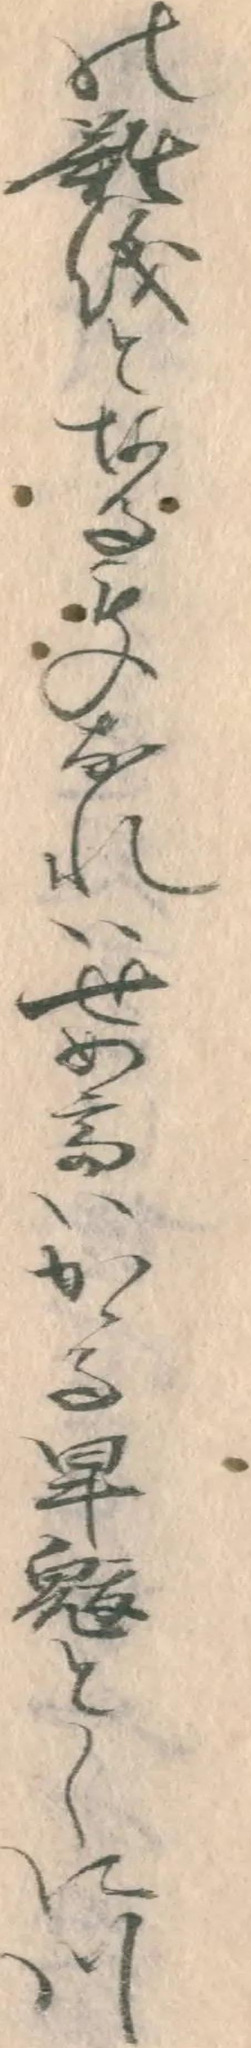の難儀となるものなれはせめてはかゝる旱魃としに川
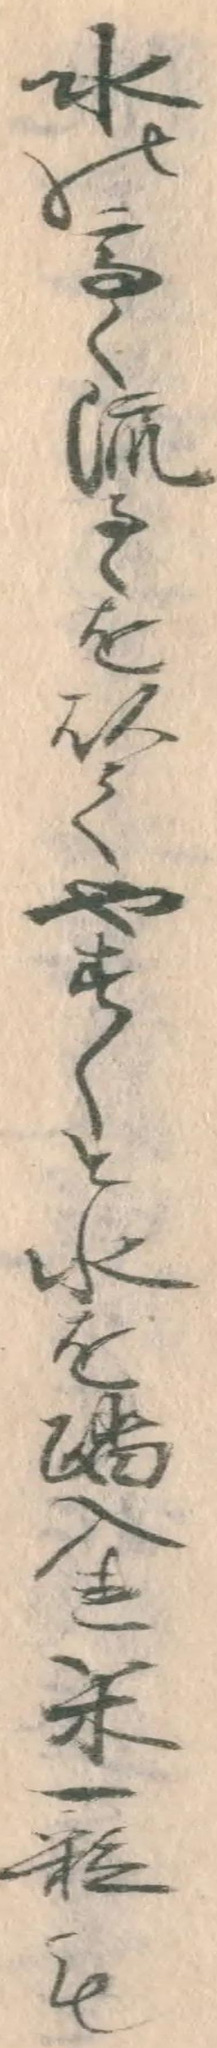水の高く流るゝを以てやす〳〵と水を踏入れ米一粒も
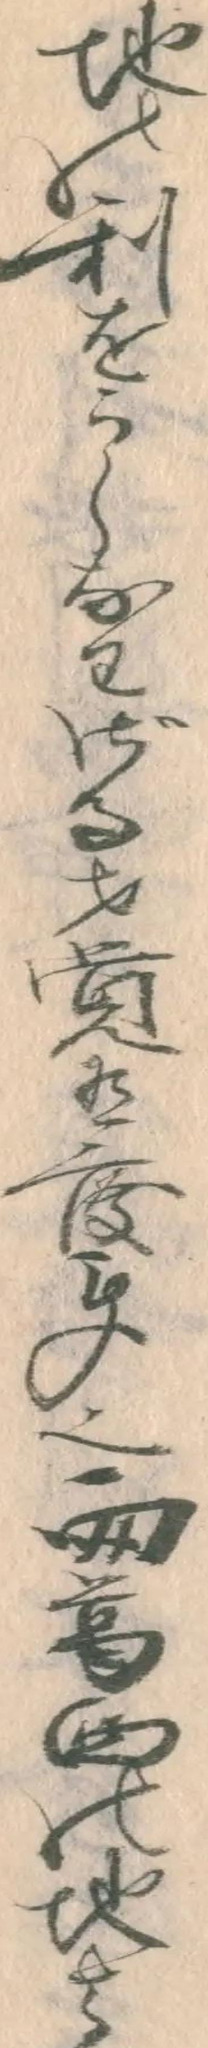地の利をうしなわざる才覚有度もの也西葛西の地は
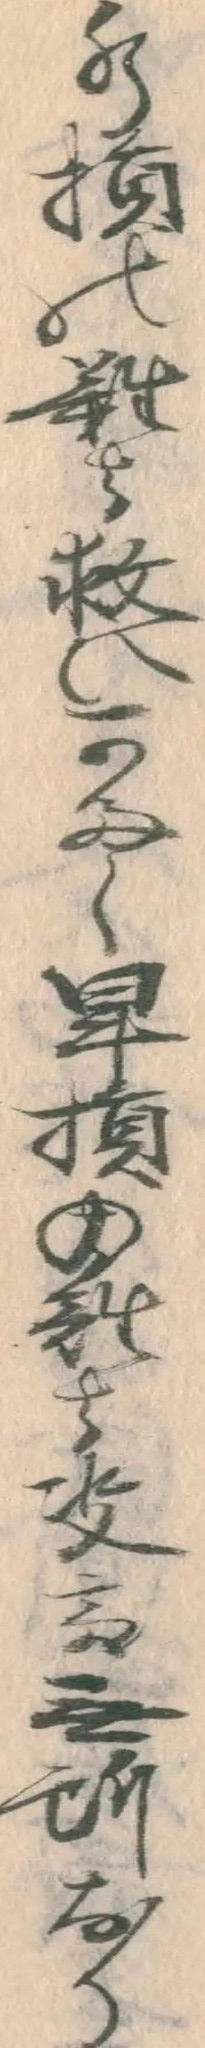水損の難は救ひかたく旱損の難は決て無所なり
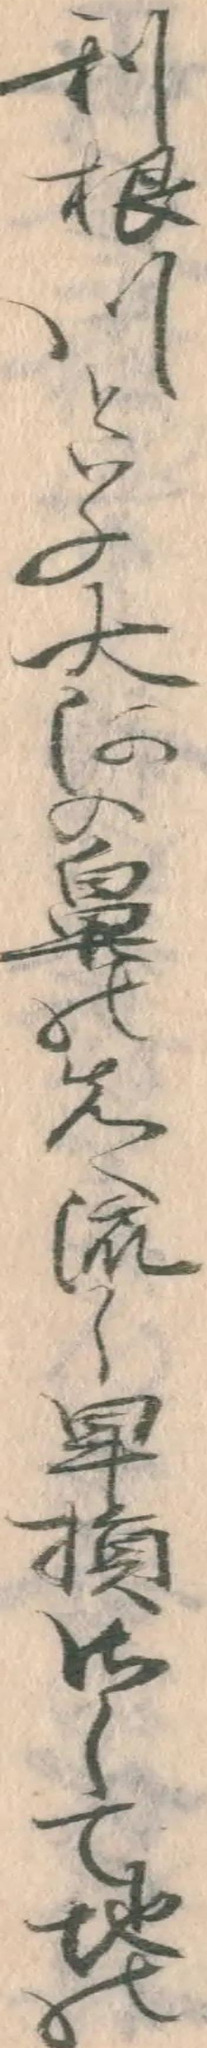利根川といふ大河の鼻の先へ流し旱損さして地の
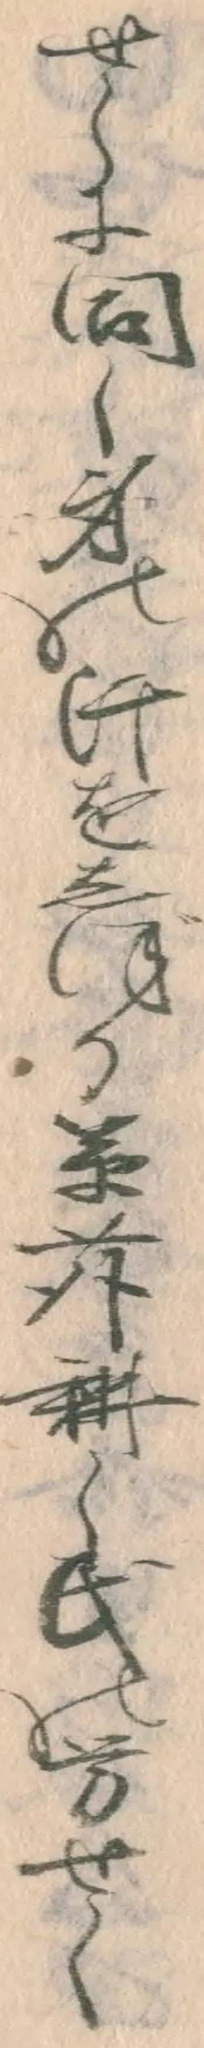せしに同し身の汗をしぼり草苅耕し民の労せし
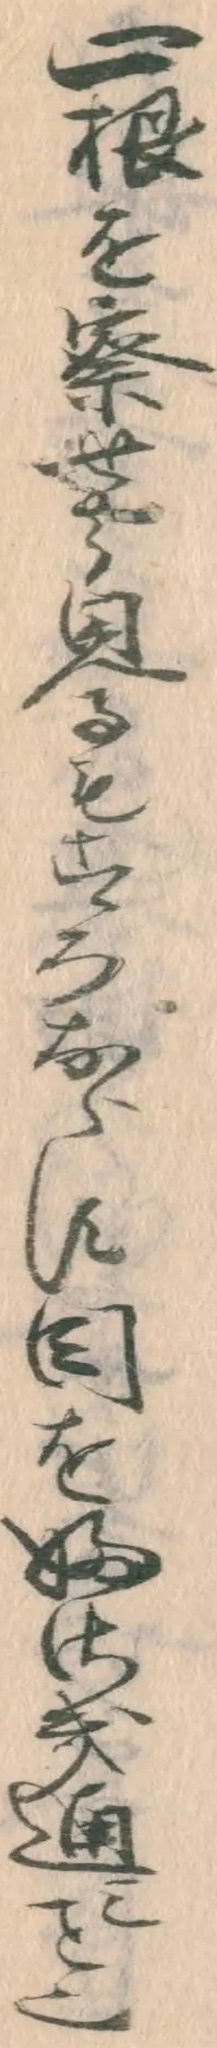心根を察せは見るもこゝろならす目をふさき通しこと也
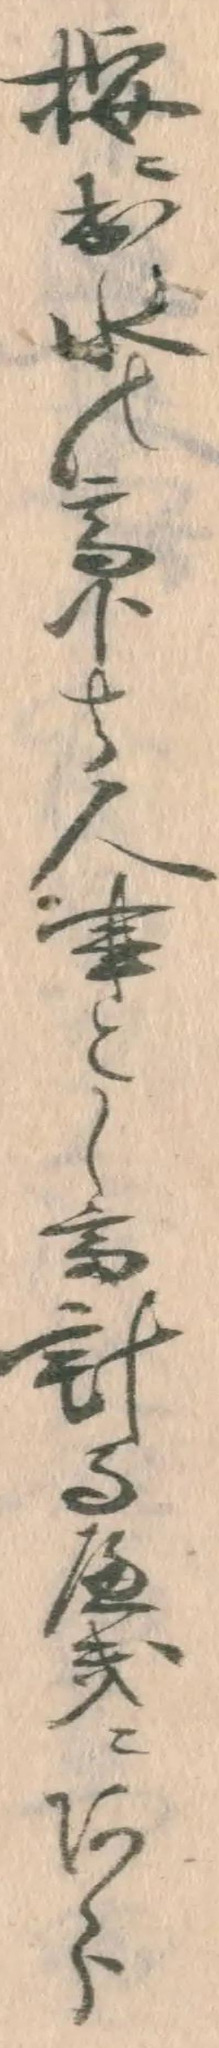按に出水の高下は人事として計る屋きにあら
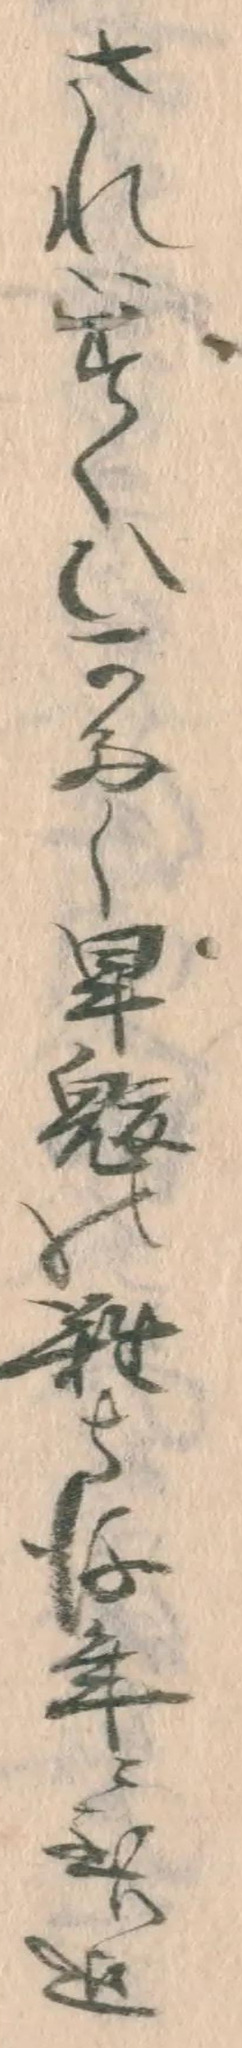されはすくひかたし旱魃の後年に至る迄
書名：四神地名録 6巻. [4]葛飾郡
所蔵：国立国会図書館 National Diet Library, JAPAN
